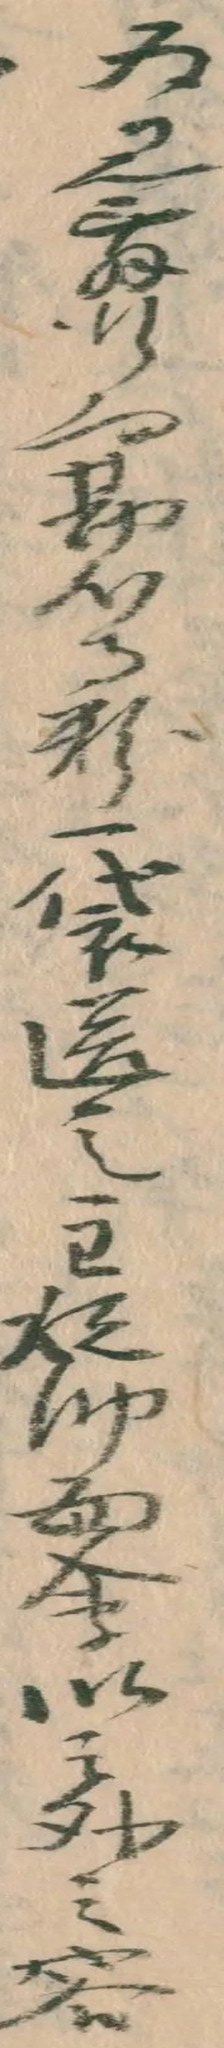為見舞行向勘心料一袋送之主税助面會以之外之容
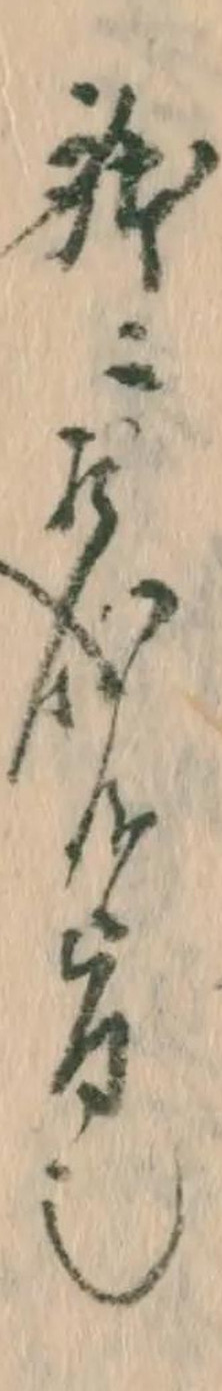躰二相成候旨也
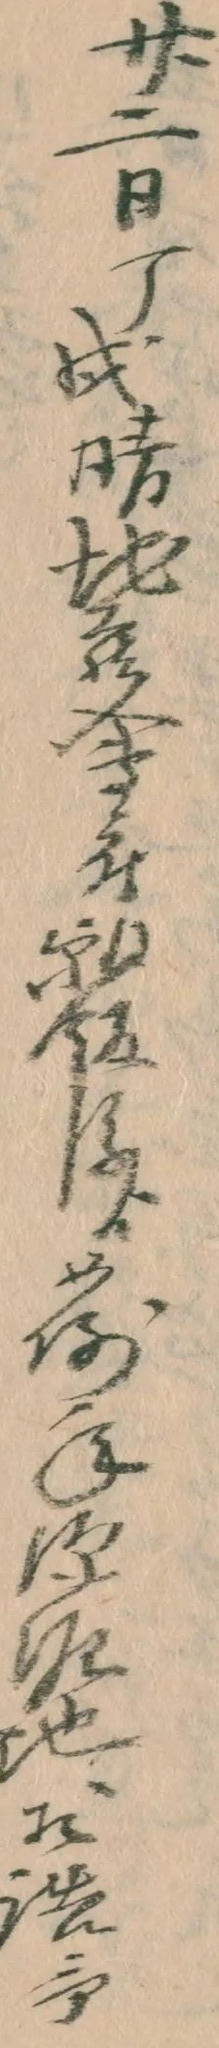廿二日丁戌晴地蔵會ニ付朝飯後ゟ如例年深泥地へ相詰予
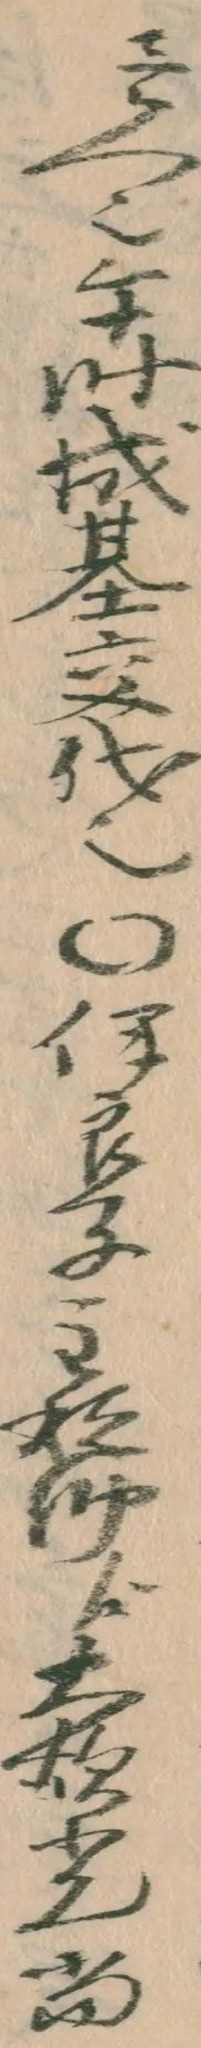壱人也午時成基交代也○伊良子主税助ゟ大炊允當
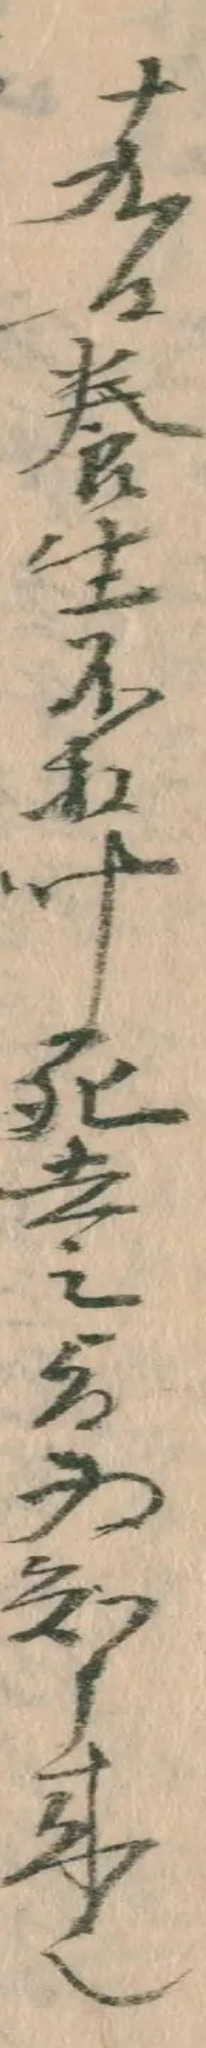十九日養生不相叶死去之旨為知申来也
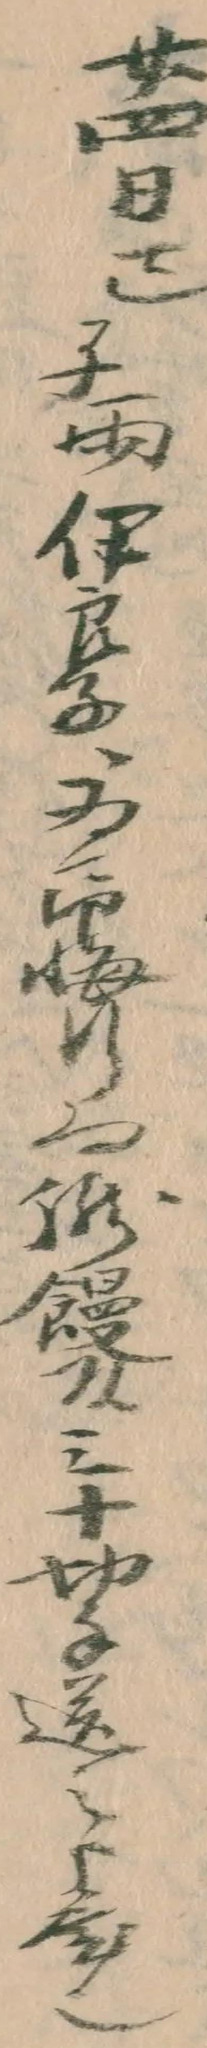廿四日乙子雨伊良子へ為弔悔行而俄饅頭三十切手送之申置也
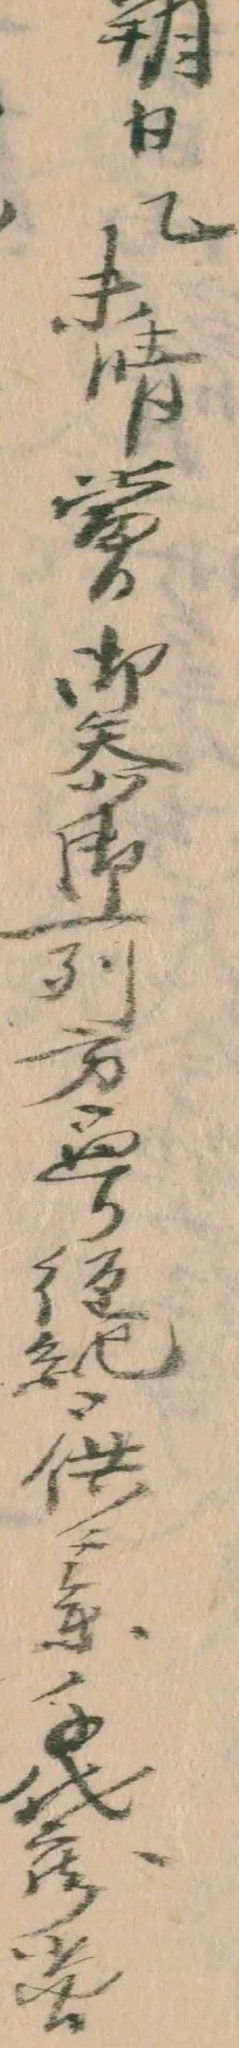朔日乙未晴當日御参御一列方廻り経紀御供ニ参手代蔵當日
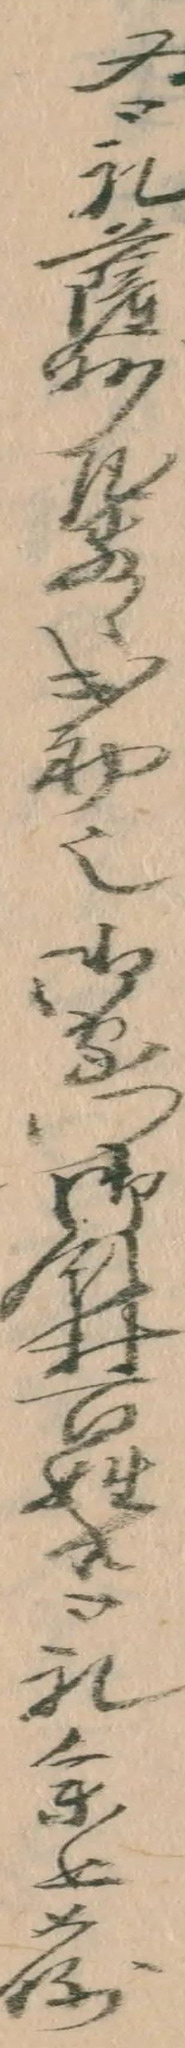為御礼薩州屋敷へ出勤也御家門御領料百姓共御礼参上如例
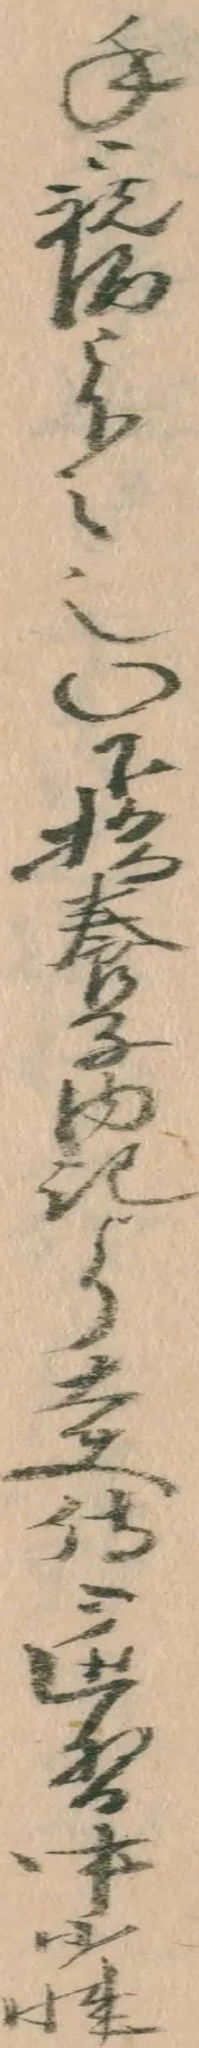年御祝酒被下也○下橋養子内記より大夫侍御近習中小性
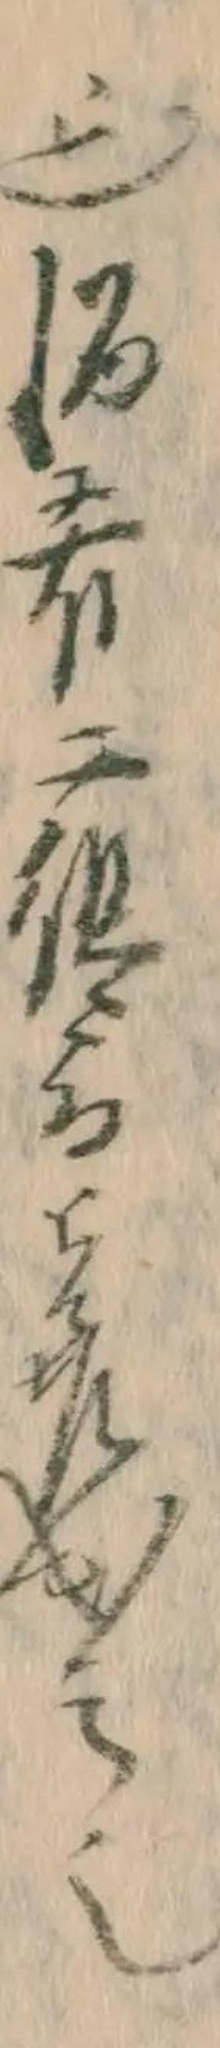迄酒肴ニ組ニ而被差出之也
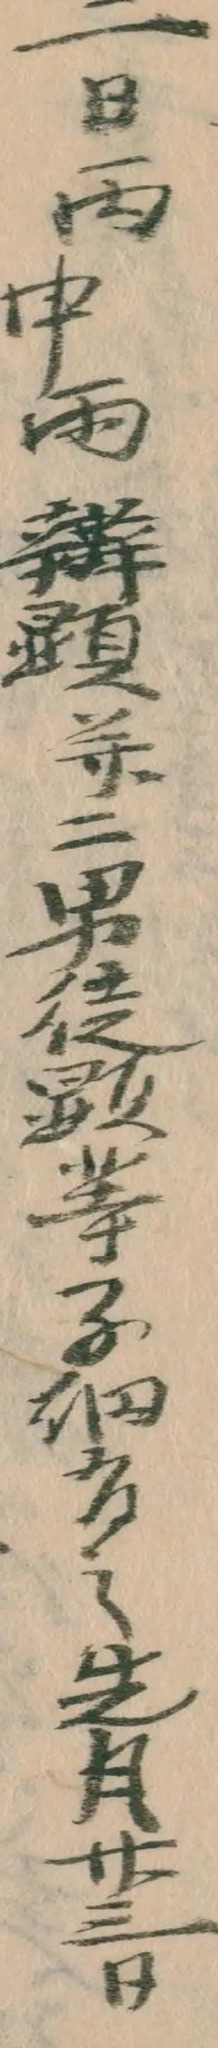二日丙申両辨顕并二里徒顕等子細有之先月廿三日
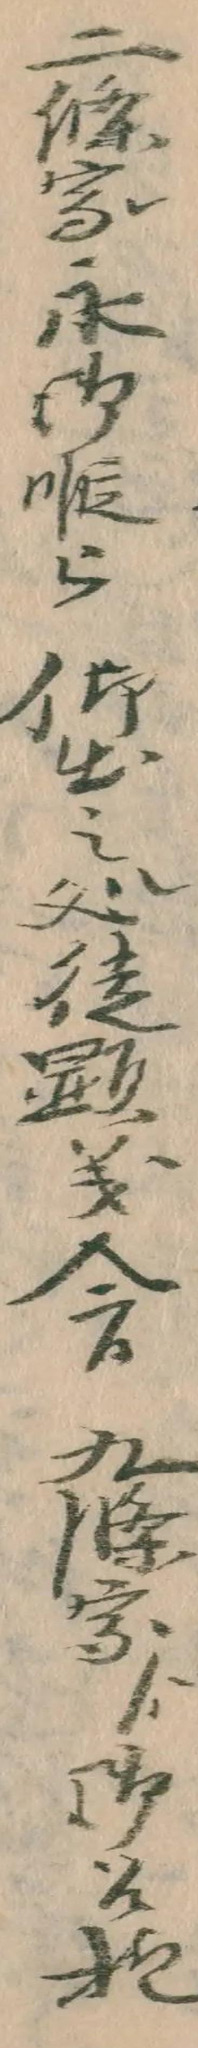二條家永御暇被仰出之処徒顕義今日九條家ゟ御召抱
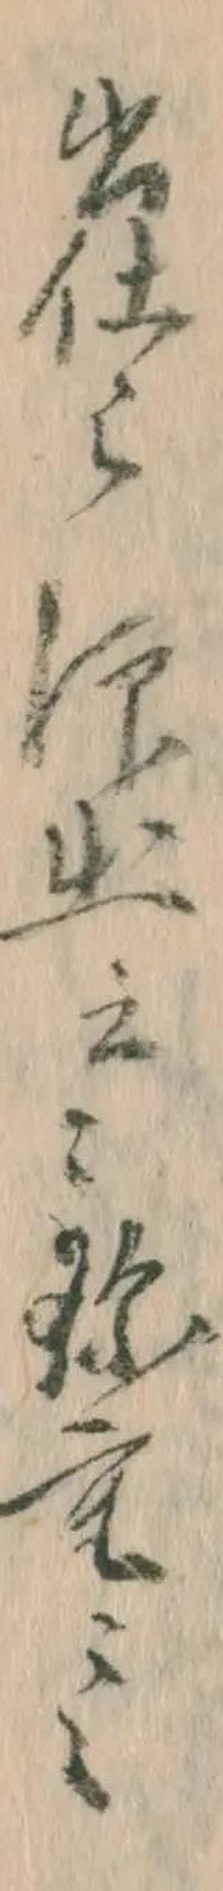出仕被仰出云々珍重々々
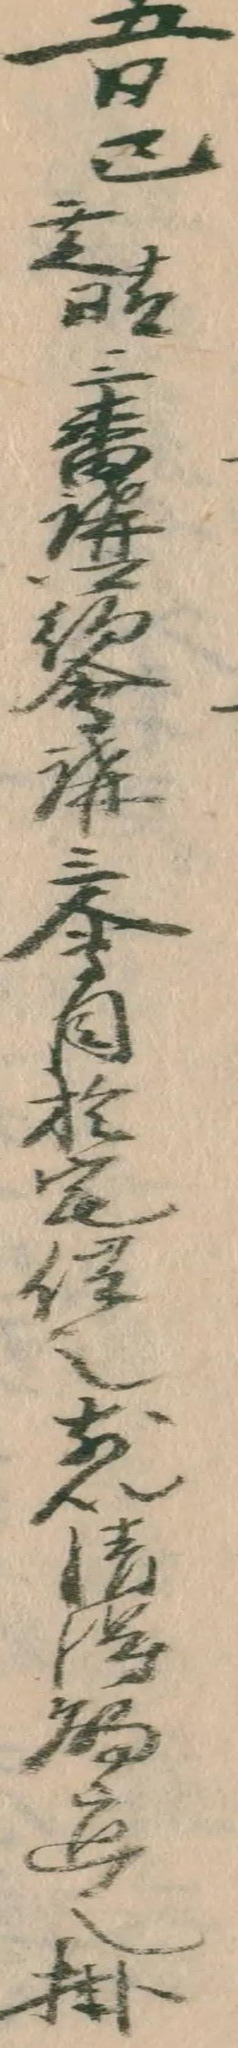五日己亥晴三番講郷約會講三會目於宅催也前以清得觸被廻也掛
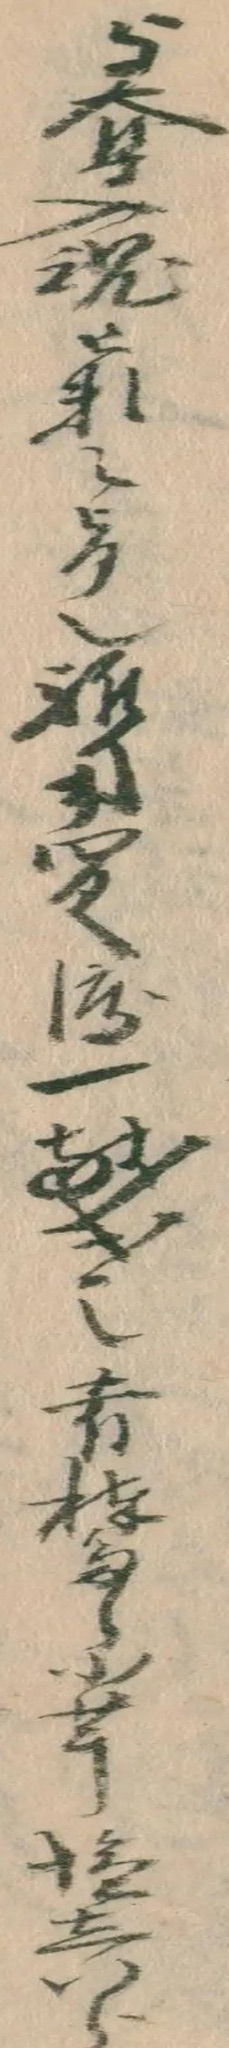与奪入魂被頼之旨成難用四匁渡一献出也肴棒たら小芋塩しいら
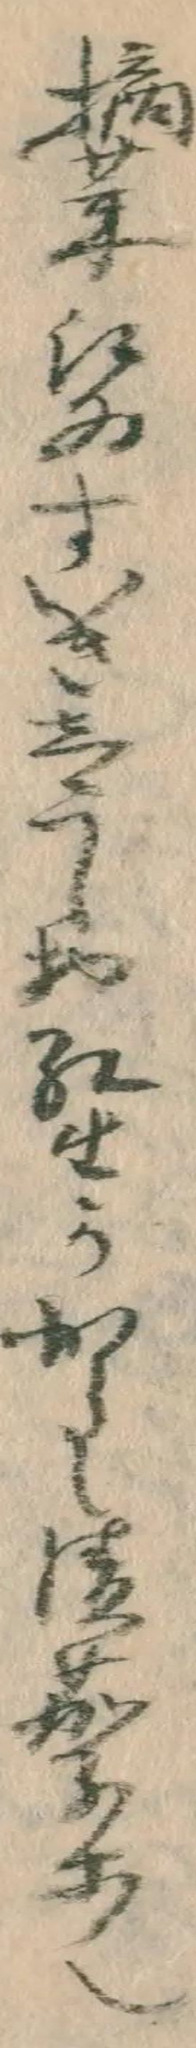摘菜紅ゐすいきしたし物紅生かからし漬茄子等也
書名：賀茂社記録. 第69冊
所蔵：国立国会図書館 National Diet Library, JAPAN
